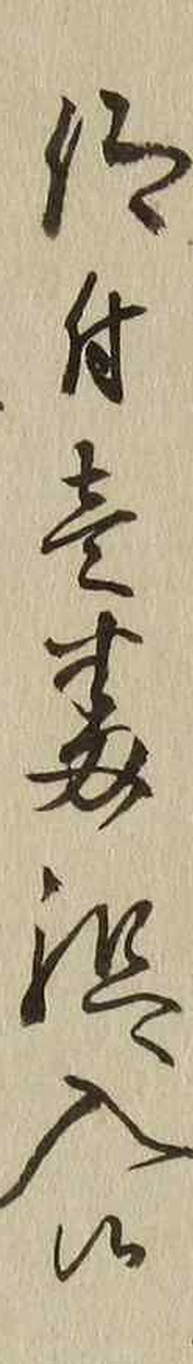仰付壱番組へ入候
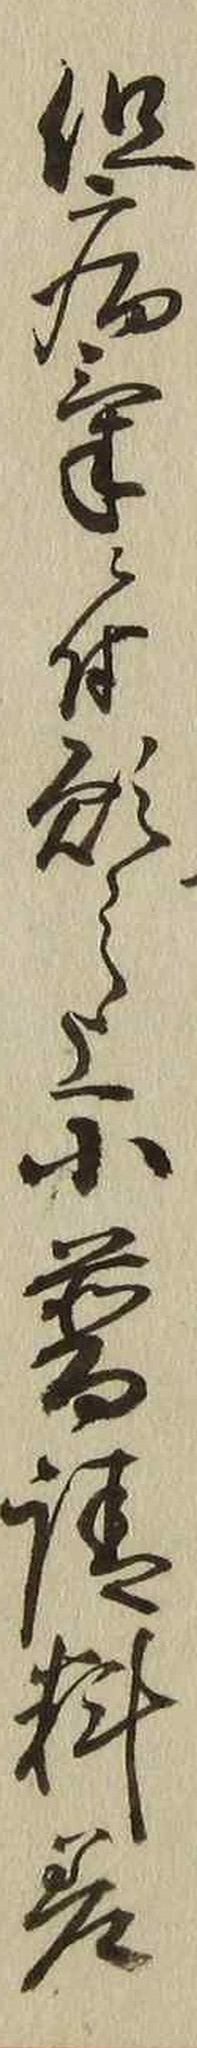但病気ニ付願之上小普請料差
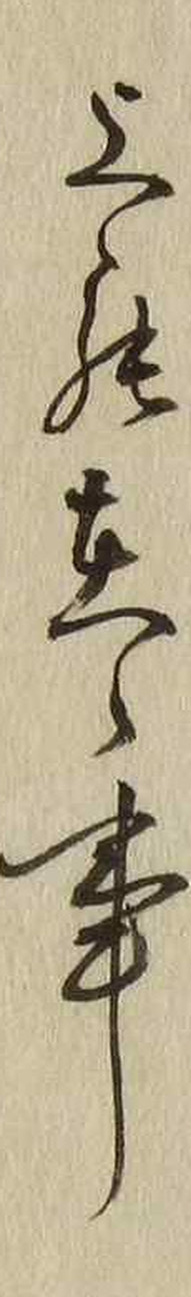上罷在候事
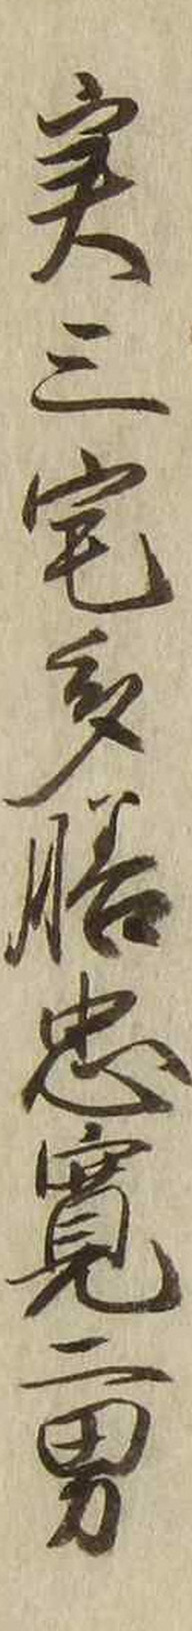実三宅多膳忠寛二男

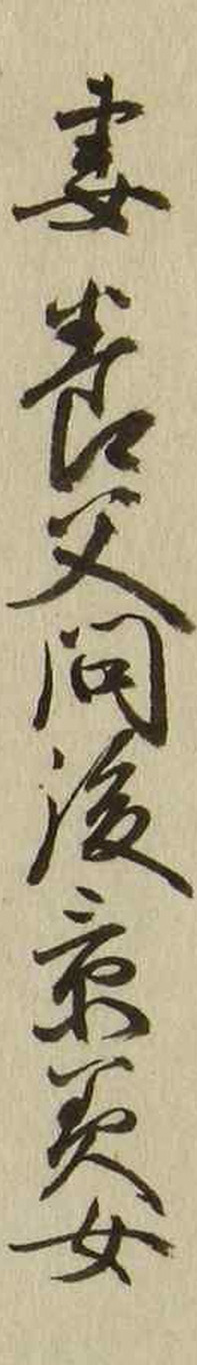妻養父問後景美女
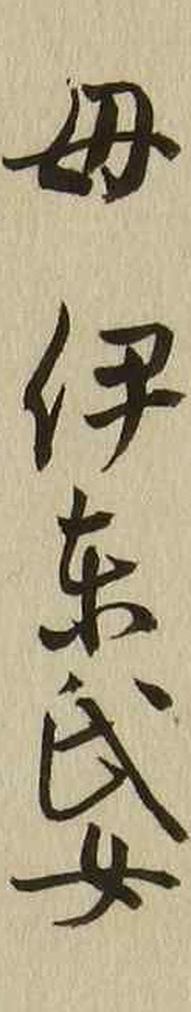母伊東氏女
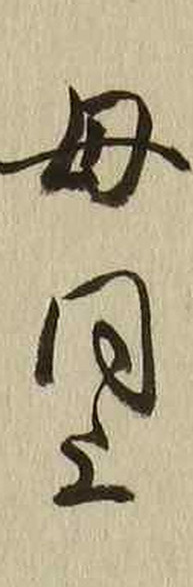母同上
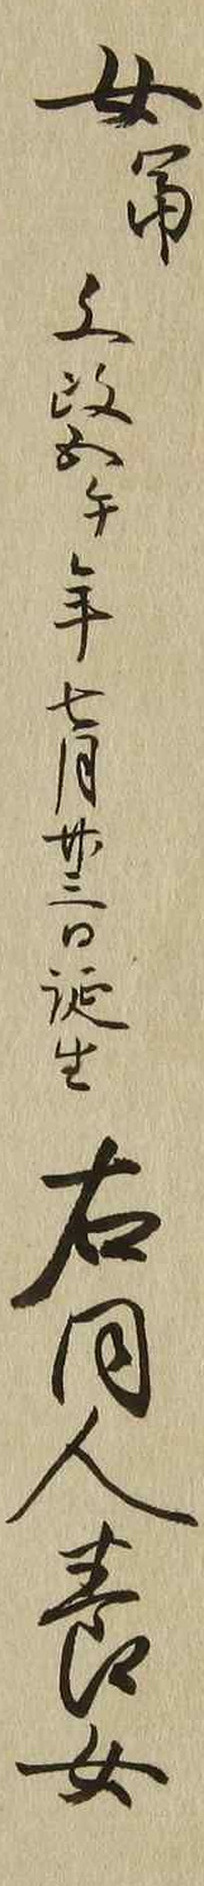女富文政五午年七月廿三日誕生右同人養女
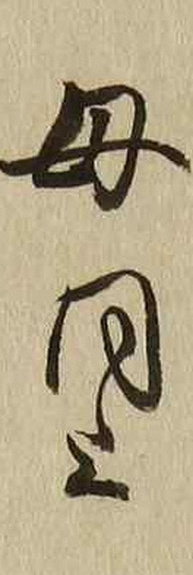母同上
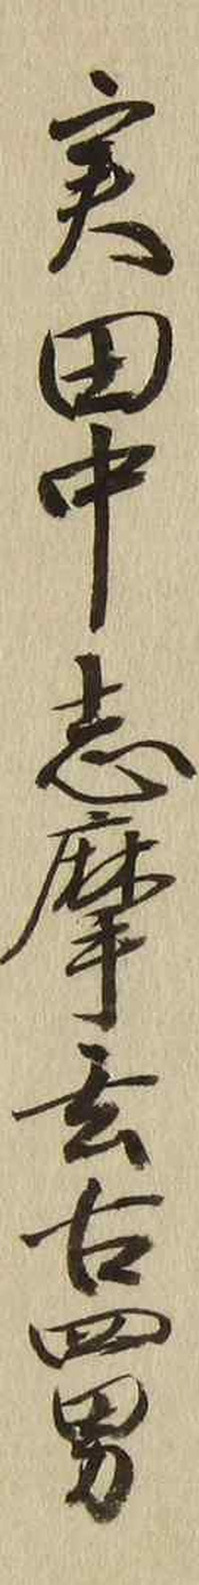実田中志摩玄古四男
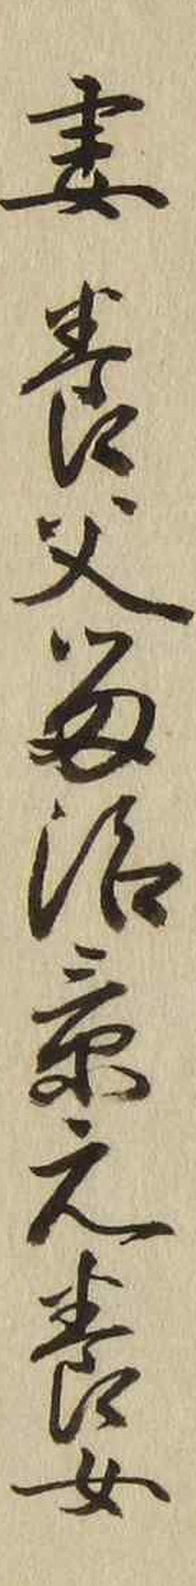妻養父留治景元養女

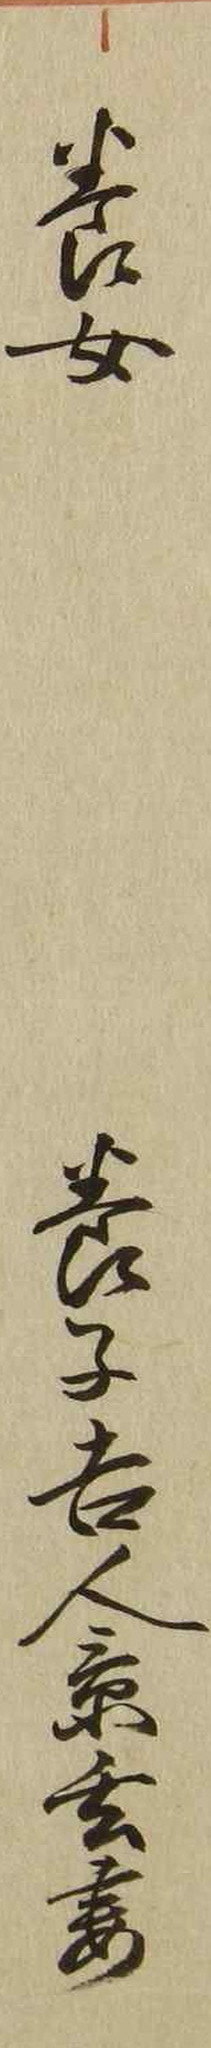養女養子吉人景玄妻
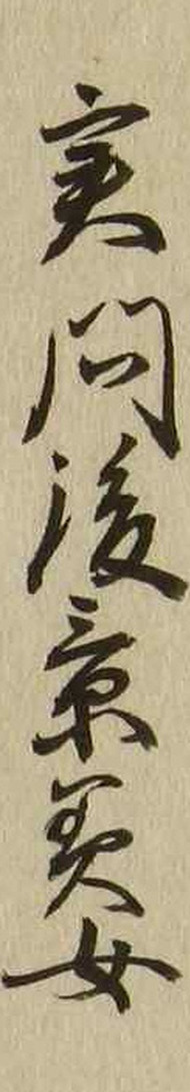実問後景美女
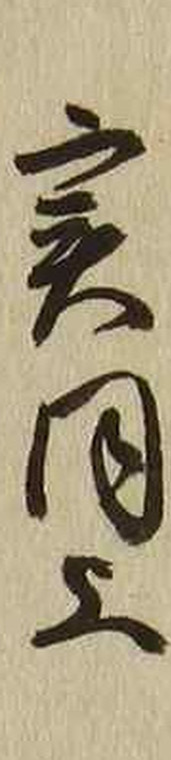実同上
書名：諸士系譜　巻之60　と之部3
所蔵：会津若松市立会津図書館
